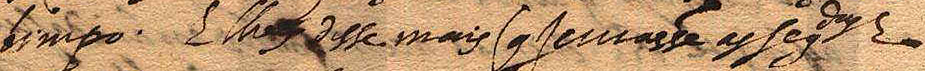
limpo. E lhes disse mais q̄ Jeiuassē as segdas E
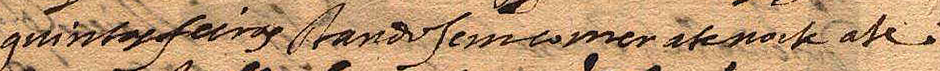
quintas feiras stando sem comer ate noite ate
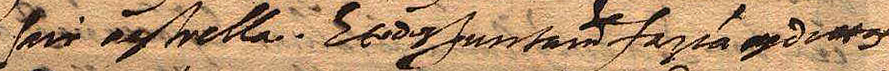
sair a estrella. E todos Juntamte faziā as dittas
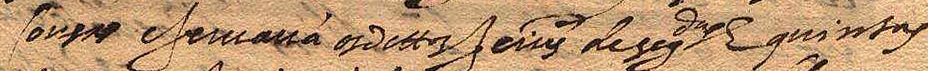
Cousas e Jeiuauā os dittos Jeiūs de segdas E quintas
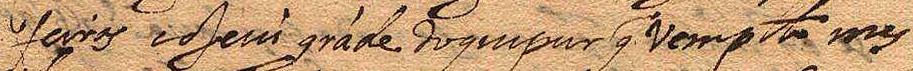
feiras e o Jeiū grāde do quipur q̄ vem pl̄lo mes
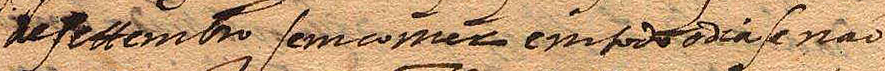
de settembro sem comer em todo o dia senaõ
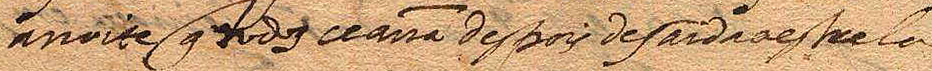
a noite q̄ todos ceauā despois de saida a estrela
